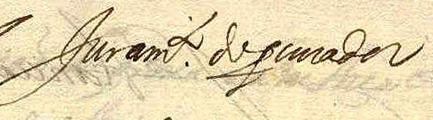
Juram.to do ꝓcurador
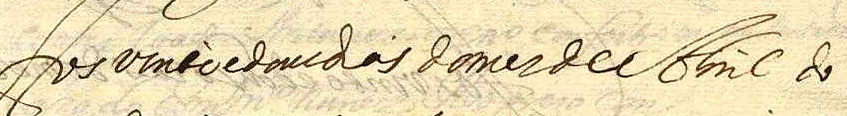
Aos vinte e dous dias do mes de Abril do
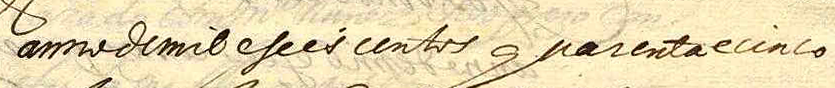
anno de mil e seiscentos quarenta e cinco
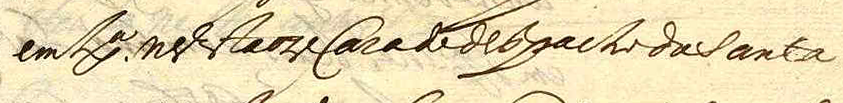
em Lxa. nos estaos e Caza do despacho da santa
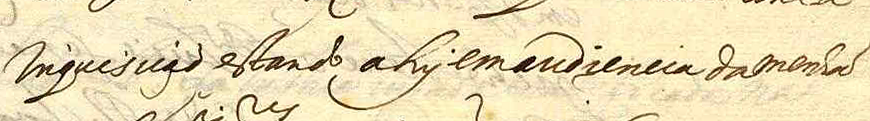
Inquisiçaõ estando ahy em audiencia da menhā
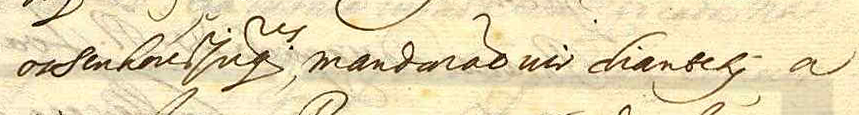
os senhores Jnqres, mandaraõ uir diante sy a
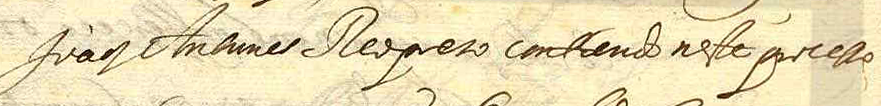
Joaõ Antunes Reo preso contheudo neste processo
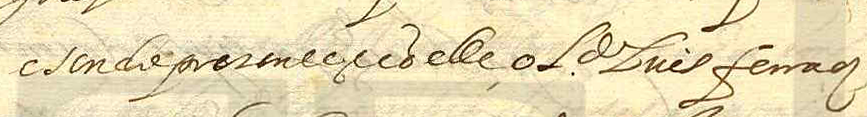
e sendo prezente e cō elle, o L.do Luis ferraõ
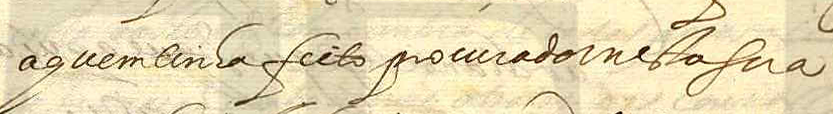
a quem tinha feito procurador nesta sua
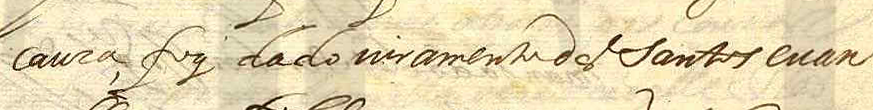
cauza, foy dado iuramento dos santos euan
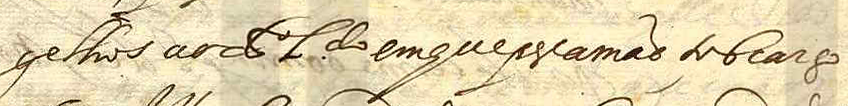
gelhos ao d̄o L.do em que pos a maõ, sob cargo
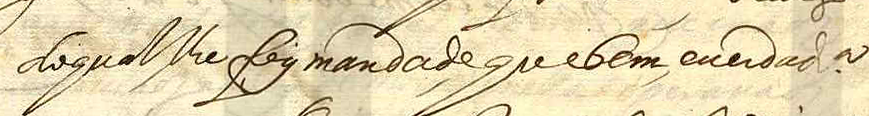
do qual lhe foy mandado, que bem, e uerdad.a
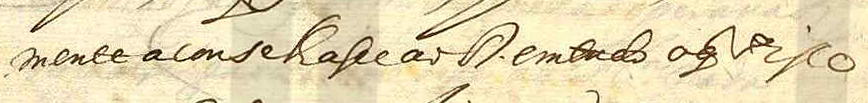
mente aconselhasse ao R. em tudo o q̄ isso
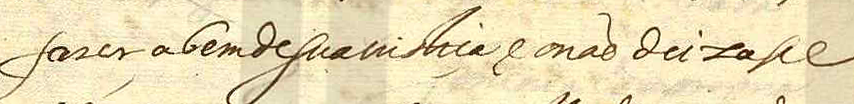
fazer, a bem de sua iustiça e o naõ deixasse
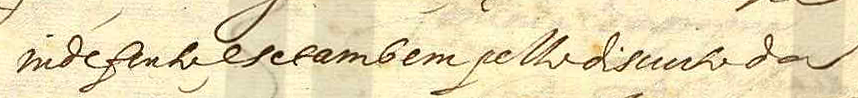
indefenso, e se tambem pello discurso da
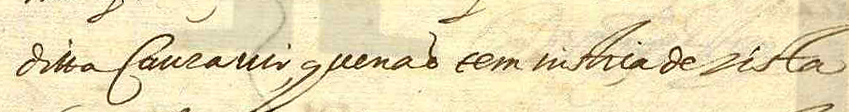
ditta Cauza uir, que naõ tem iustiça dezista
